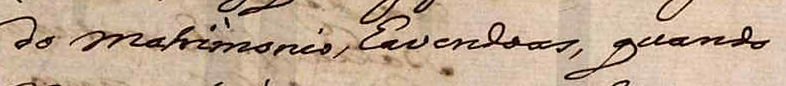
do matrimonio, havendoas, quando
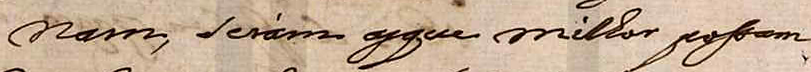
nam, seram as que milhor possam
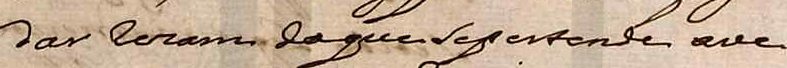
dar Rezam do que se pertende ave
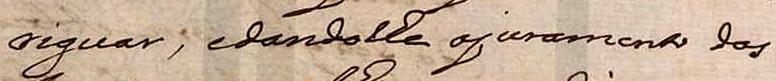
riguar, e dandolhe o juramento dos
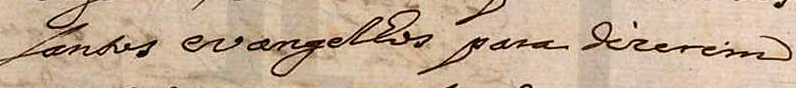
santos evangelhos para dizerem
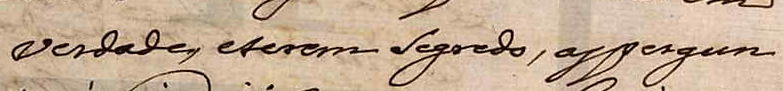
verdade, e terem segredo, as pergun
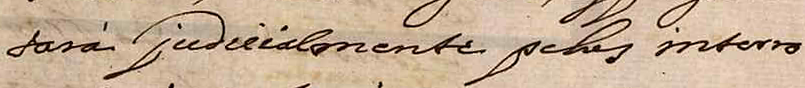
tará judicialmente pelos interro
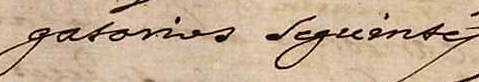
gatorios seguintes
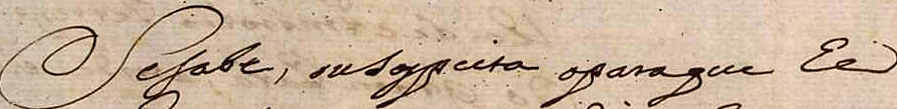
Se sabe, ou sospeita o para que he
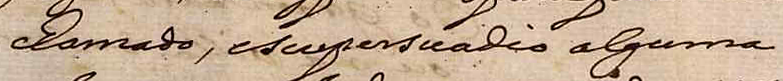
chamado, e se o persuadio alguma
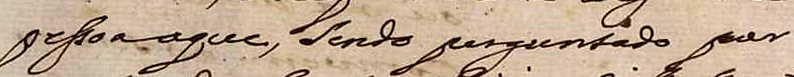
pessoa a que, sendo perguntado por
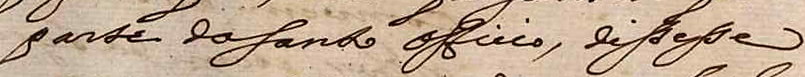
parte do santo officio, dissesse
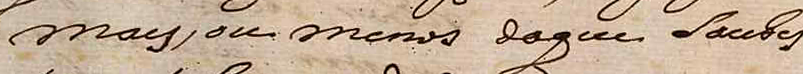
mais, ou menos do que soubes
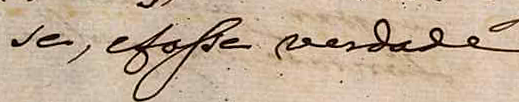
se, e fosse verdade
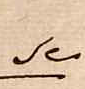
se
